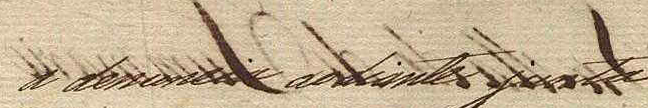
a denuncia ao diante junta
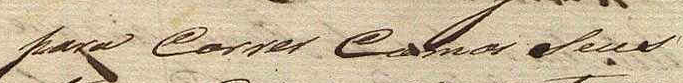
para correr Com os seus
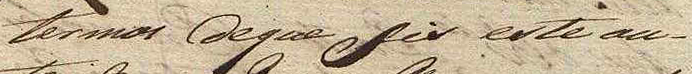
termos de que fis este au
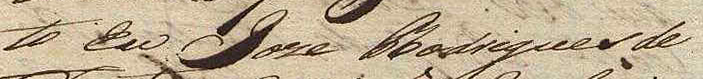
to Eu Ioze Rodrigues de
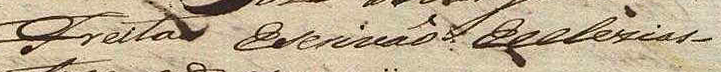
Freitas Escrivaõ Ecclezias
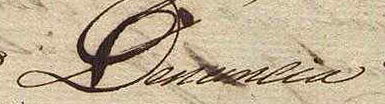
Denuncia
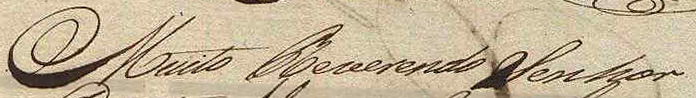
Muito Reverendo Senhor
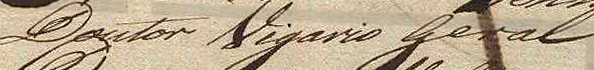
Doutor Vigario Geral
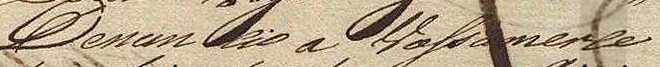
Denuncio a Vossa merce
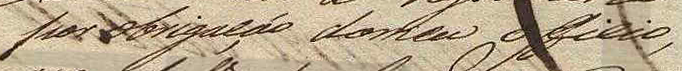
por obrigaçaõ do meu officio,
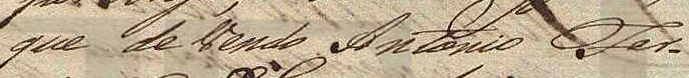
que deVendo Antonio OFer
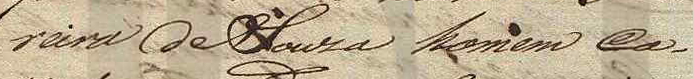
reira de Souza homem ca
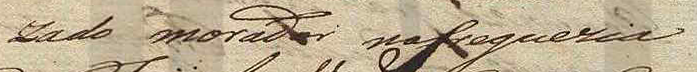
zado morador na freguezia
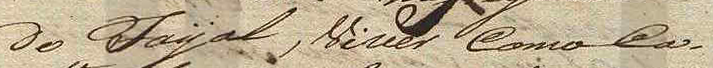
do Fayal, Viuer Como Ca
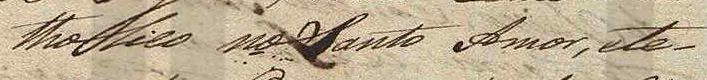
tholico no Santo Amor, e te
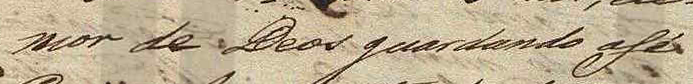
mor de Deos guardando a fé
